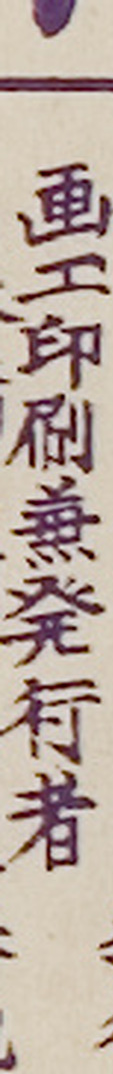画工印刷兼発行者
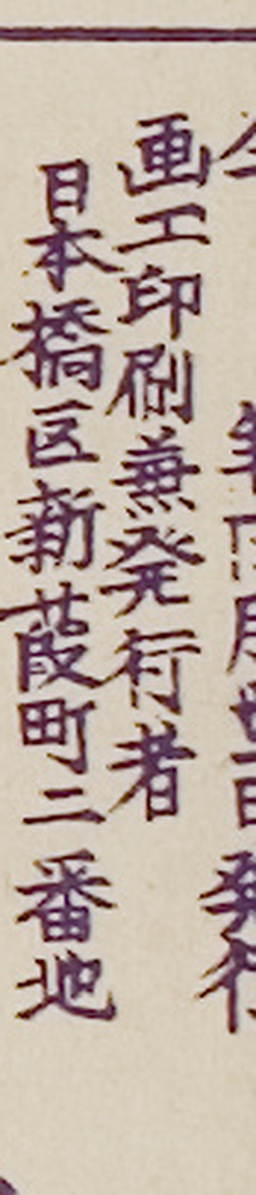日本橋区新葭町二番地
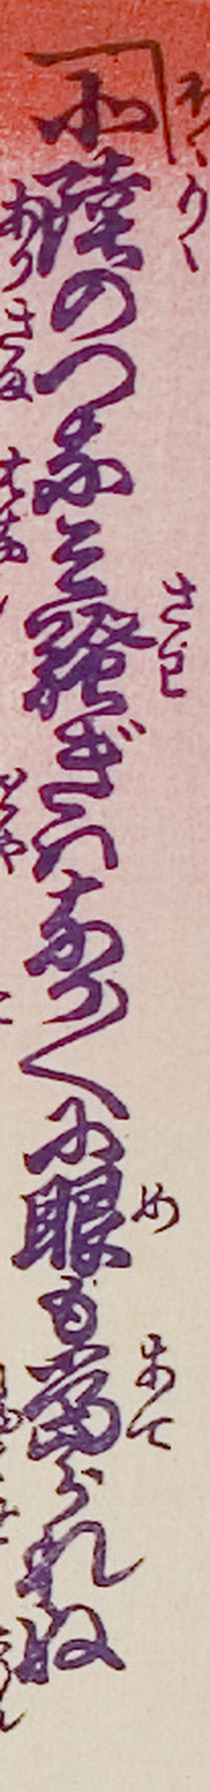乁北陸のつなミ騒ぎハなに眼も當られぬ
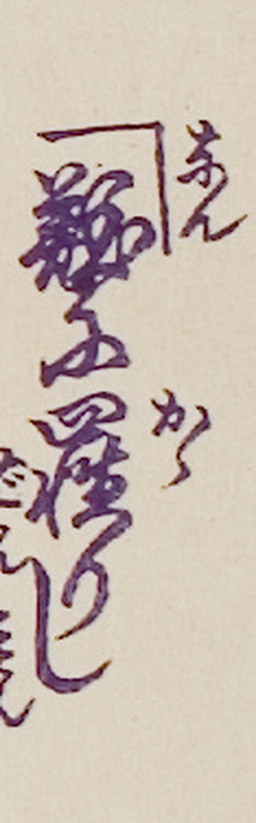乁難に罹りし
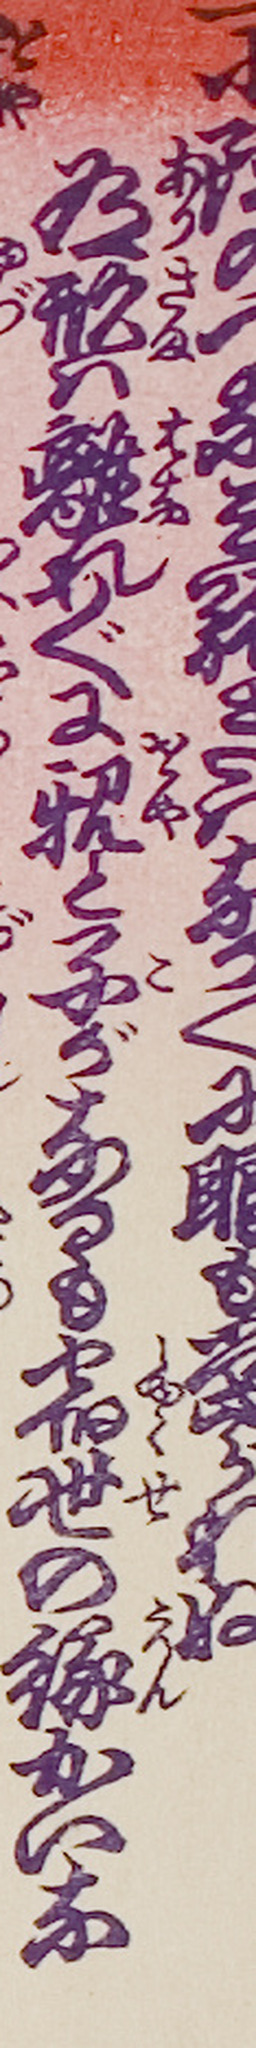有形ハ離れ〳〵に親と子がなるも宿世の縁かいな
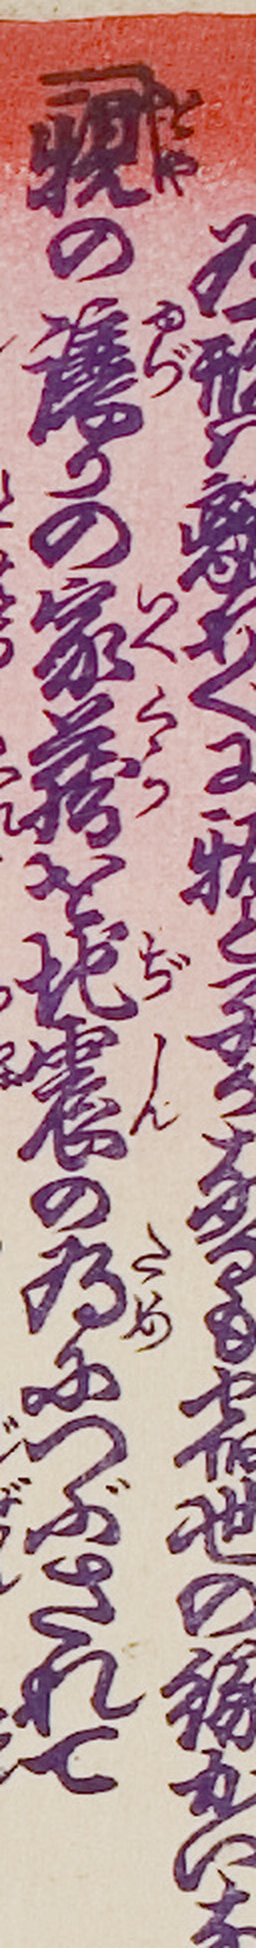乁親の譲りの家蔵を地震の為につぶされて
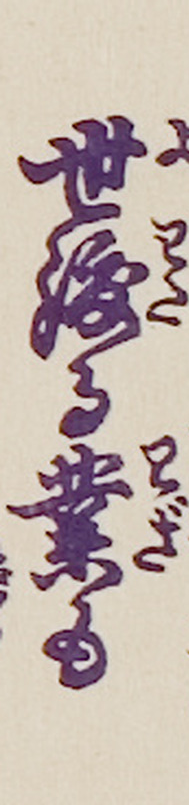世渡る業も
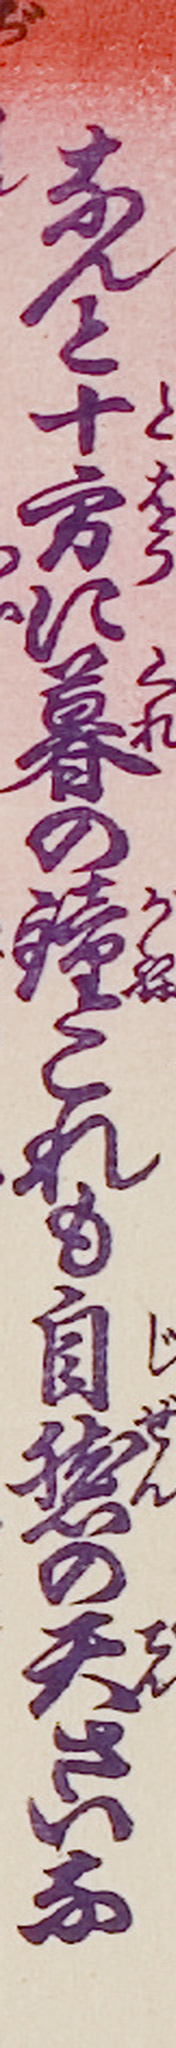なんと十方に暮の鐘これも自然の天さいな
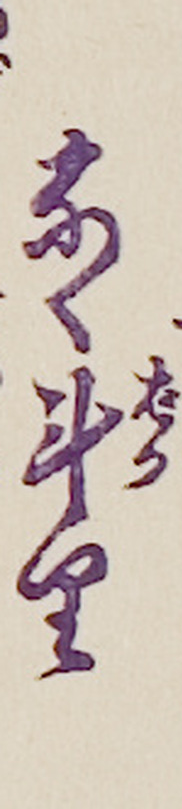なく斗り
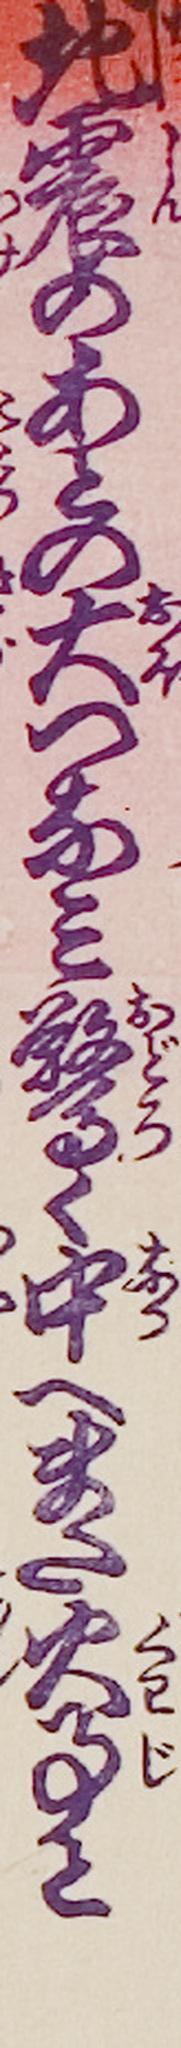乁地震のあとの大つなミ驚く中へまた火事と
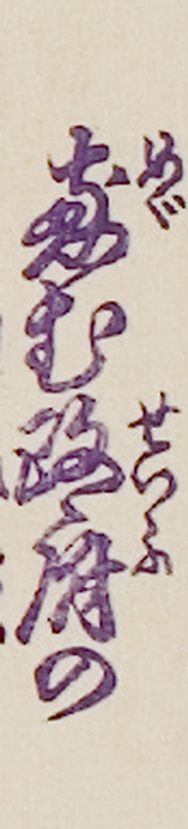恵む政府の
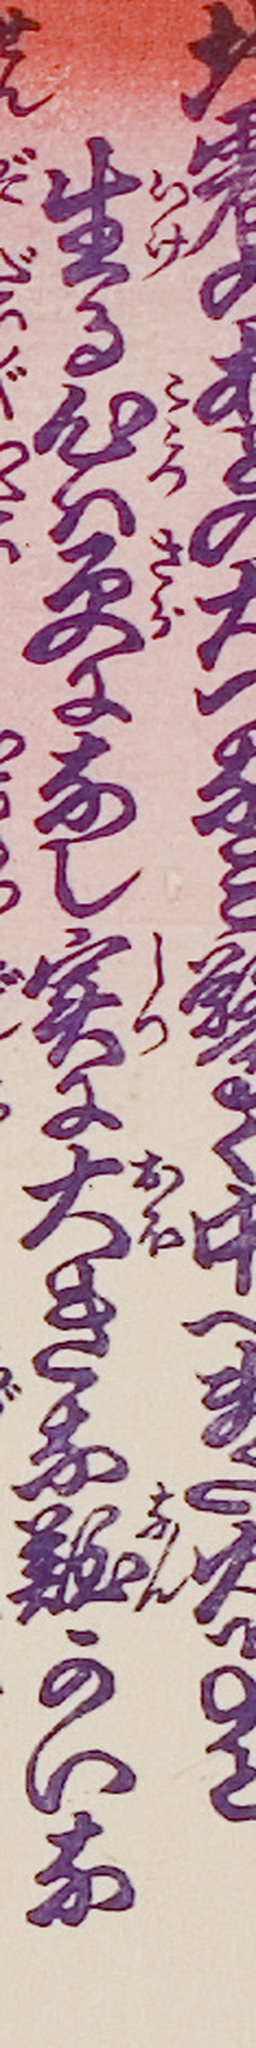生る心ハ更になし實に大きな難かいな
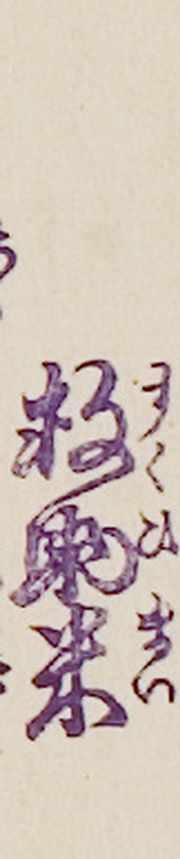救助米
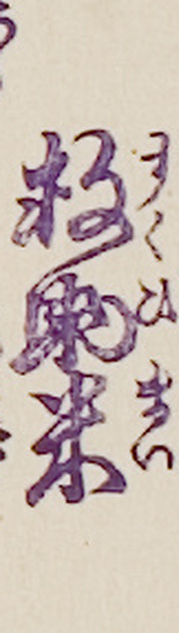救助米
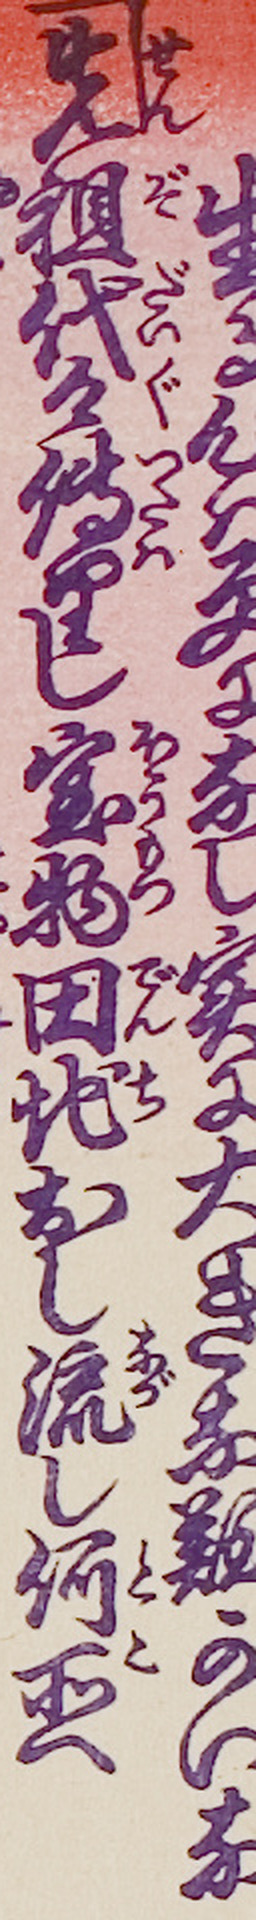乁先祖代々伝里し宝物田地おし流し何所へ
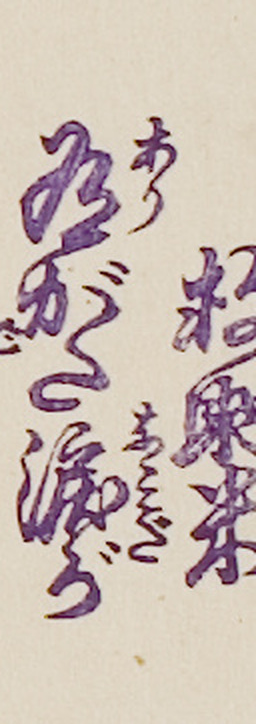有がた涙が
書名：北陸三県大つなミ一ツトセぶし
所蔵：東京大学総合図書館 General Library in the University of Tokyo, JAPAN
